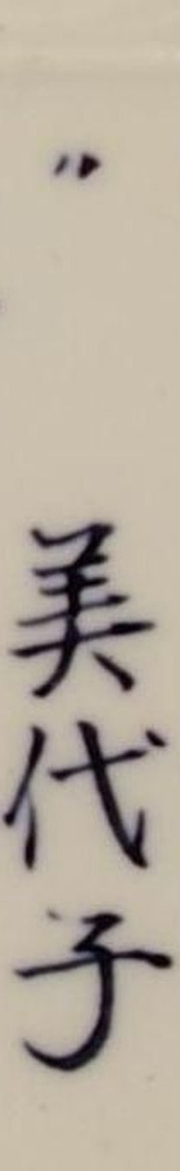美代子
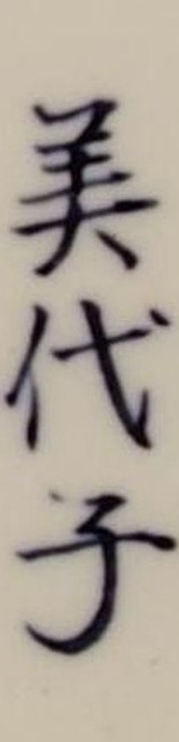美代子
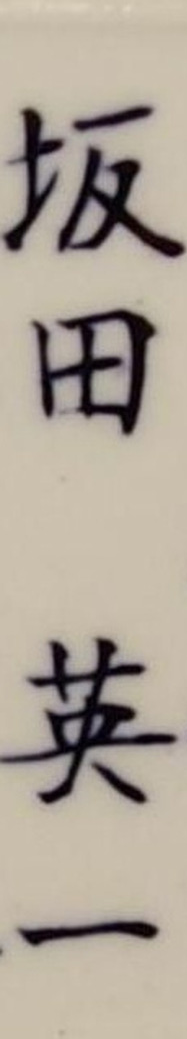坂田英一
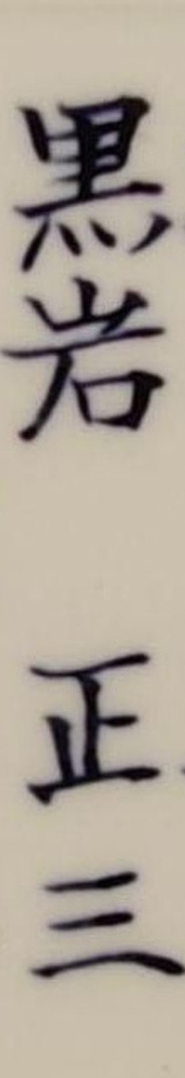黒岩正三
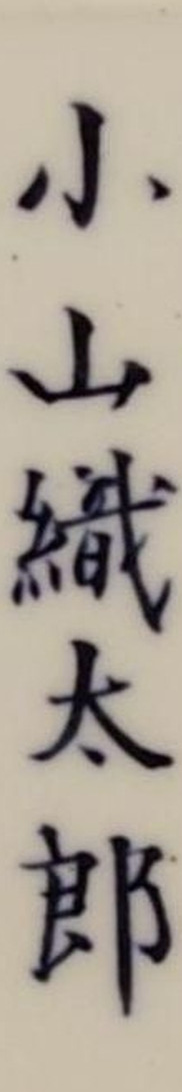小山織太郎
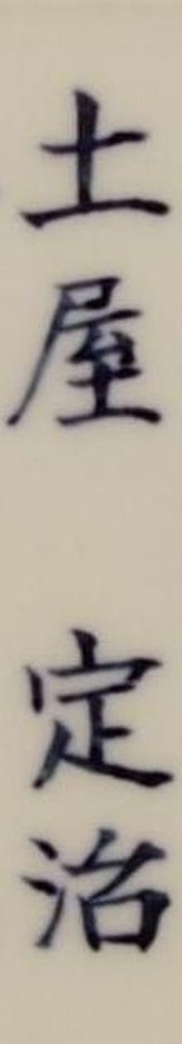土屋定治
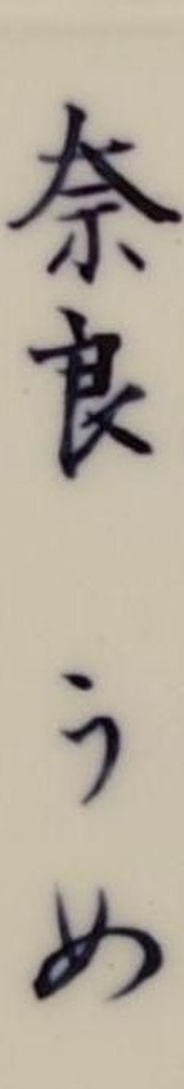奈良うめ
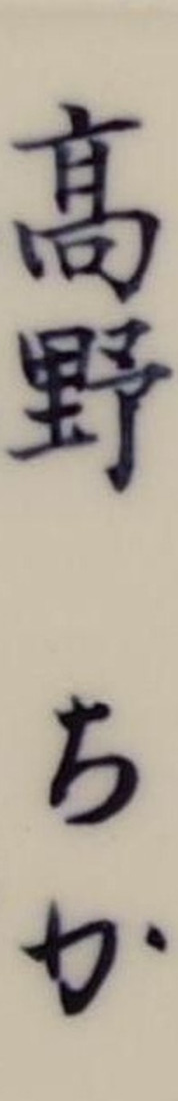高野ちか
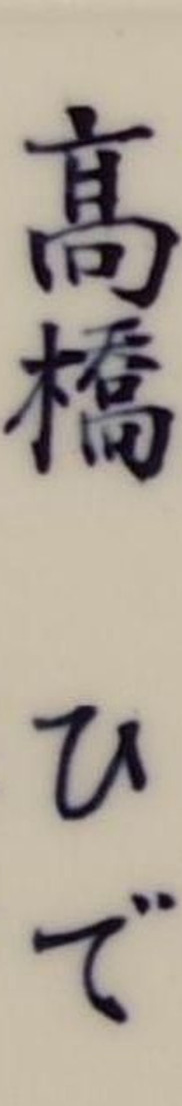高橋ひで
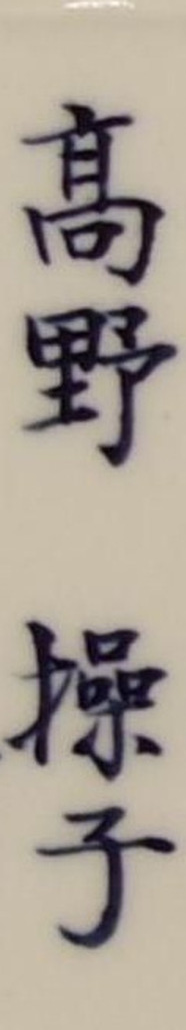高野操子
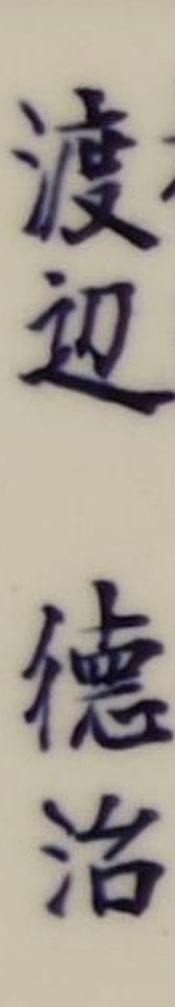渡辺徳治
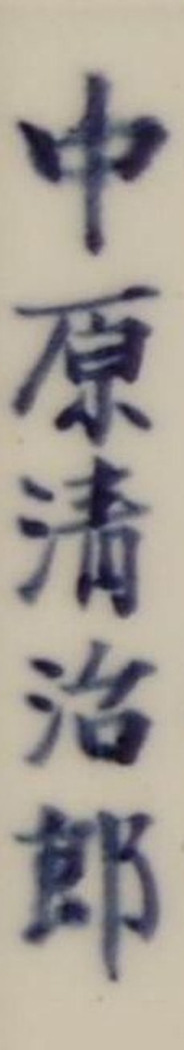中原清治郎

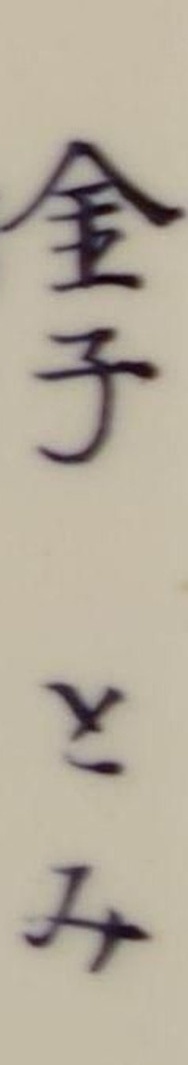金子とみ
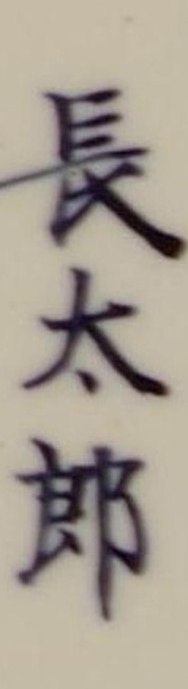長太郎
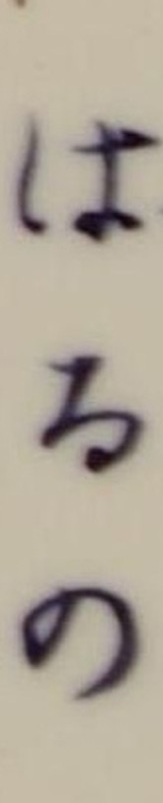はるの
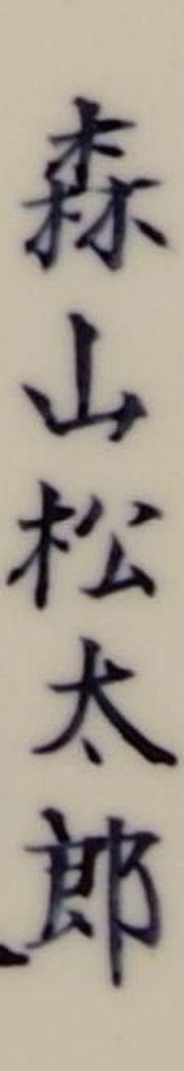森山松太郎
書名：E~L
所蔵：高野山金剛峯寺
